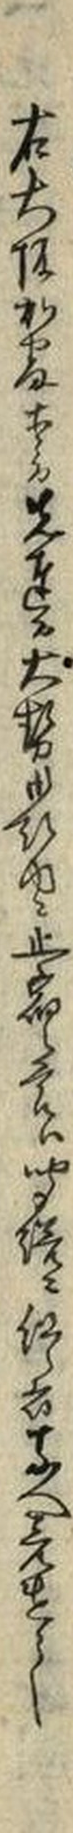右大坂加番等ニ而先達而大勢御領内ニ止宿之節ハ聞繕ニ組之者両人左差遣之候
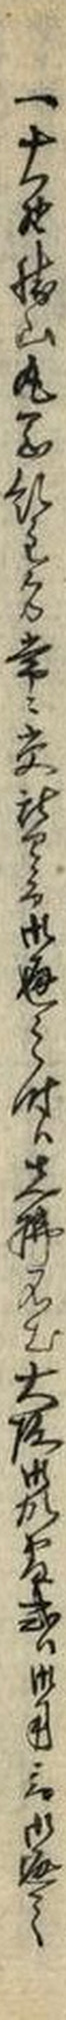一大野勝山丸岡領主方常ニ交替ニ而御通之時ハ先払不出大坂御加番或ハ御用ニ而御通之
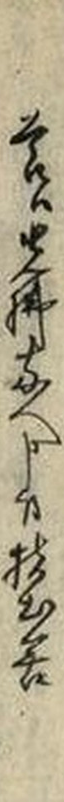節ハ先払両人申付指出筈
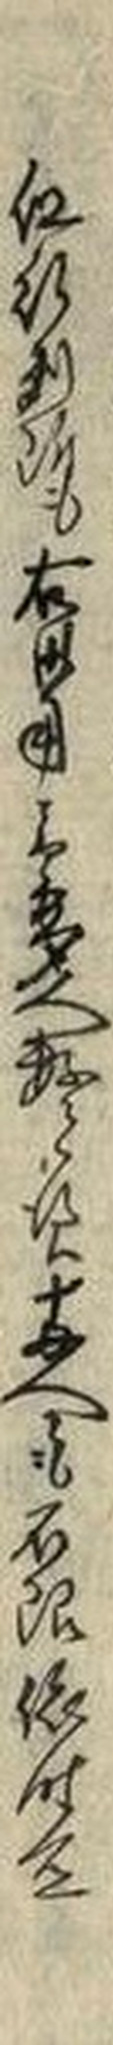但行列附も右御用ニ而多人数ニ候得ハ両人ニも不限依時宜
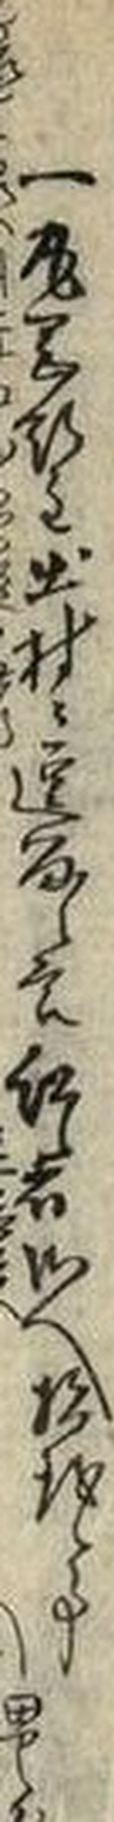一丸岡領主出村ニ逗留之節組之者弐人指越候事
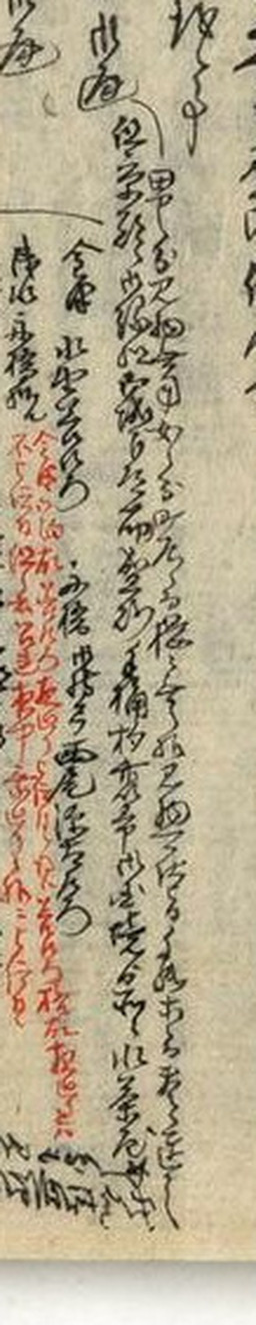但京都へ御縁組御城下道筋盛砂手桶杓竹箒御国境ゟ所々水茶屋
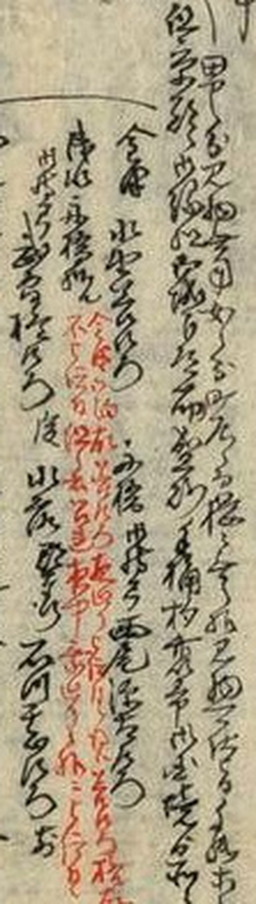金津水野善左衛門舟橋御持弓西尾源太左衛門
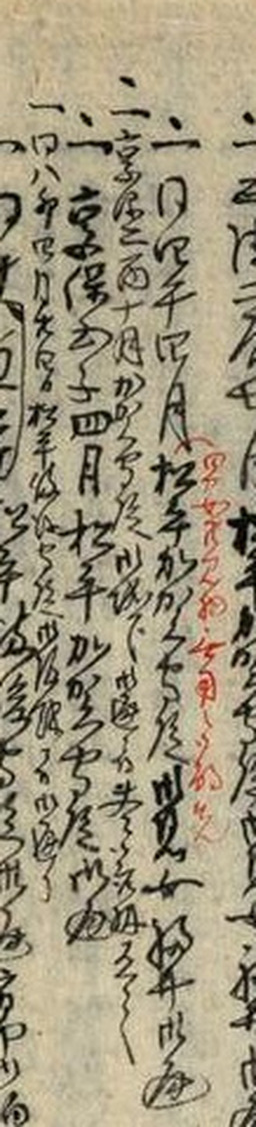・一享保二酉十月加賀守殿御城下御通ニ付夫々御取扱有之
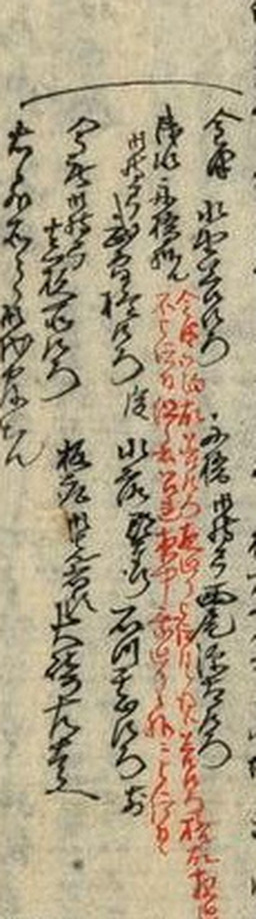御持弓武曽権左衛門後水落郡奉行石川甚左衛門前
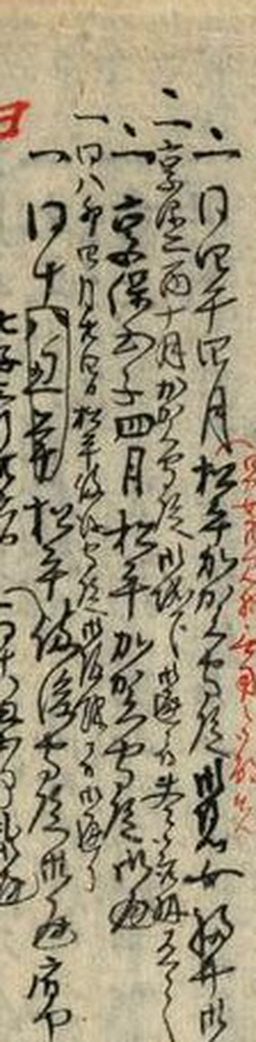・一享保五子四月松平加賀守殿御通
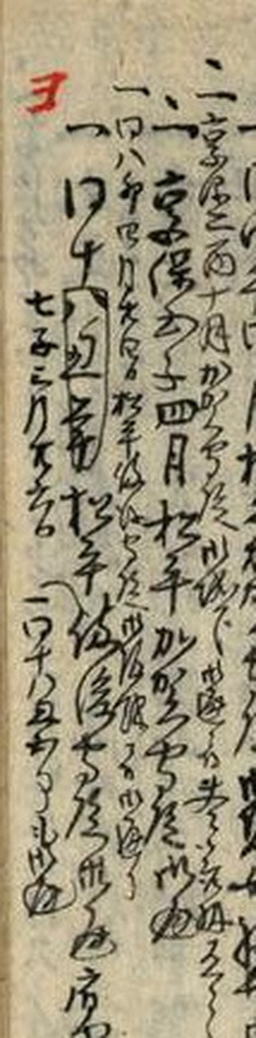一同八卯四月廿四日松平備後守殿御帰還館ニ付御通り
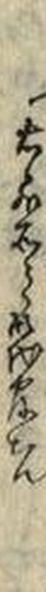右之外所々へ御代官出ル

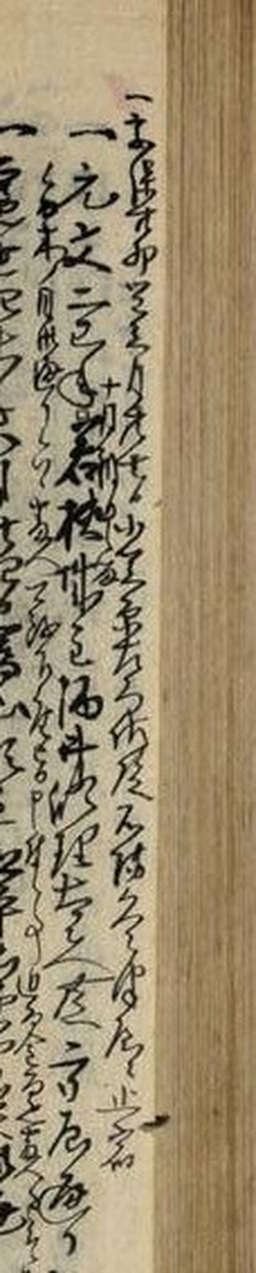一享保廿卯閏三月廿七日小笠原左衛門佐殿石場久々津屋ニ止宿
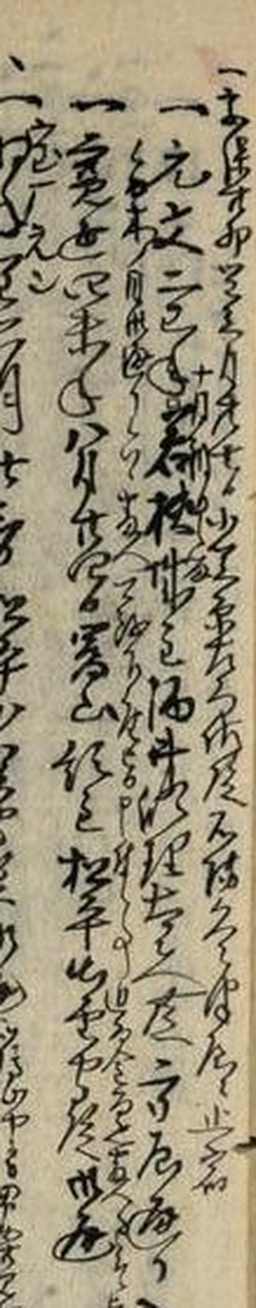候而木ノ目御通り候ハヽ番人可致下座旨申付候事追而金百疋番人へ被下候旨
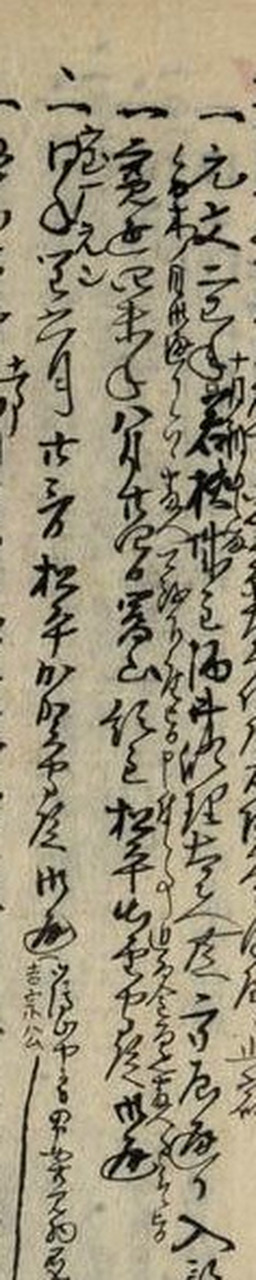一寛延四未年八月廿四日富山領主松平出雲守殿御通
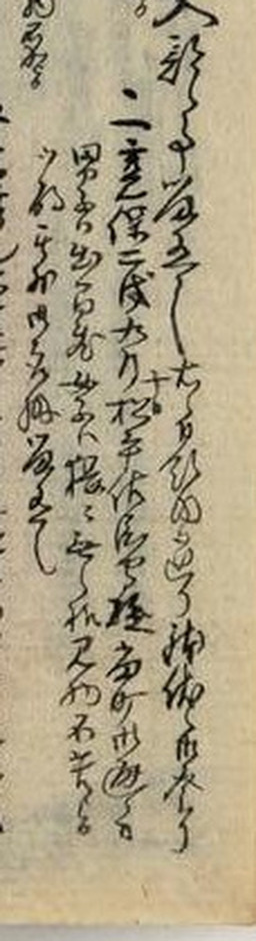・一寛保二戌九月十日松平佐渡守殿当町御通ニ付
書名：御国他国諸事之部
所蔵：福井県文書館 Fukui Prefectural Archives
